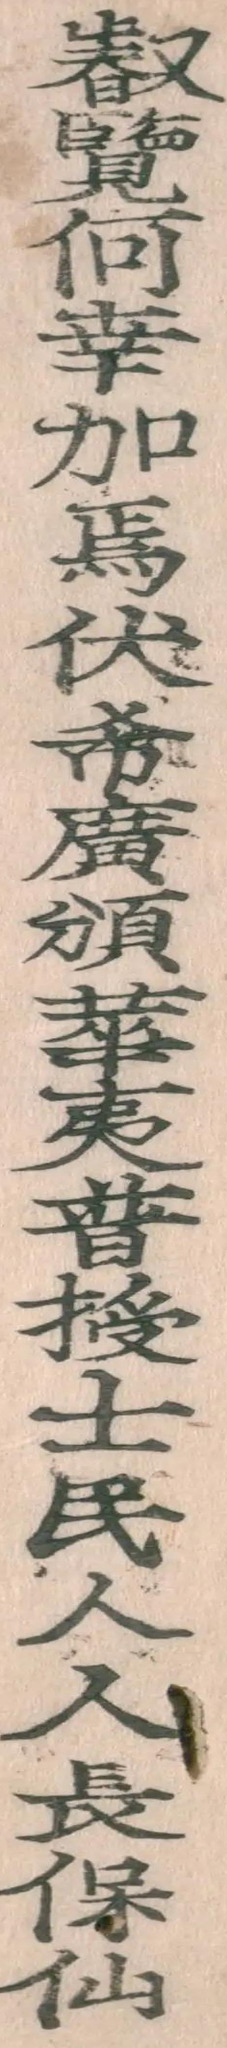覧何幸加焉伏希広領華夷普授士民人人長保仙
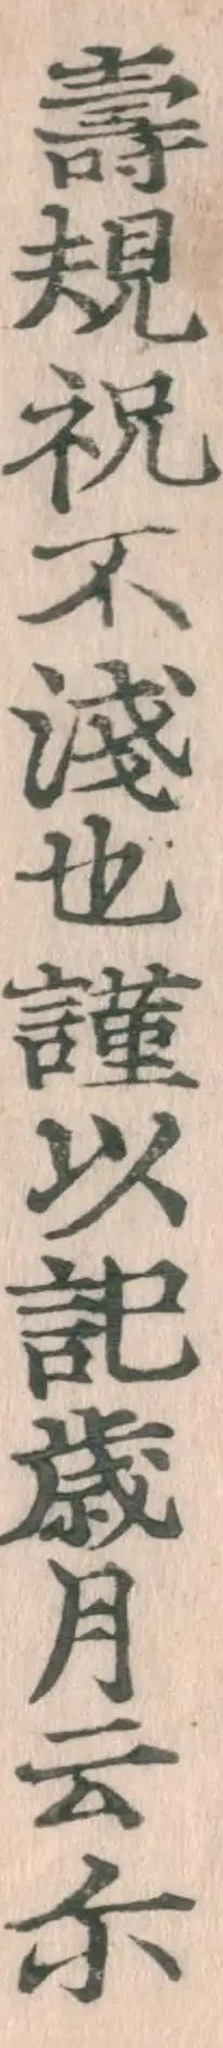寿規祝不浅也謹以記歳月云爾
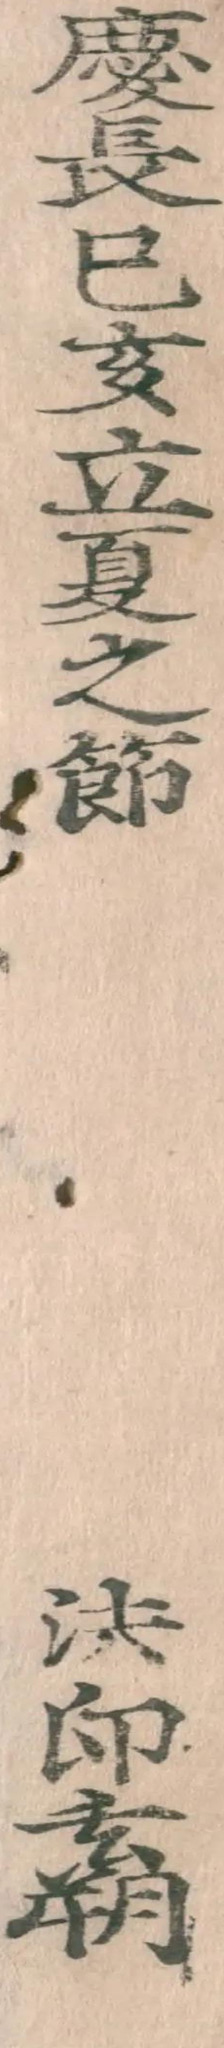慶長巳亥立夏之節法印玄朔
